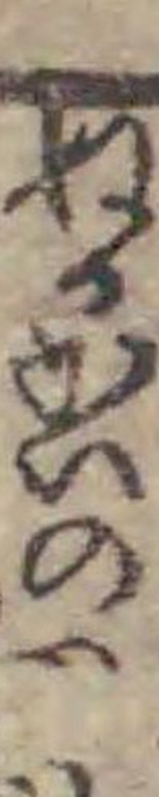ぬかかいの
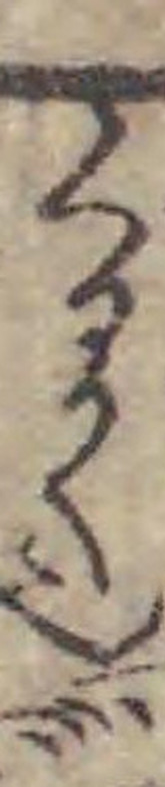くるうへ也
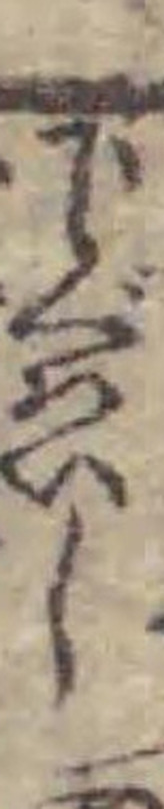下ぐはいし
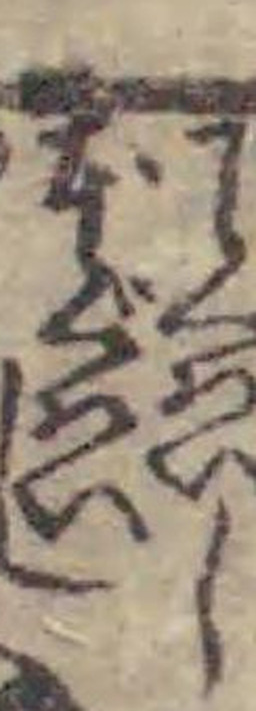本ぐはいし
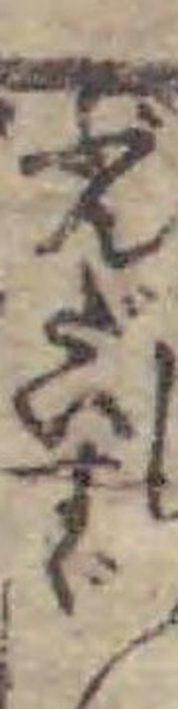ぶんだいすゞ
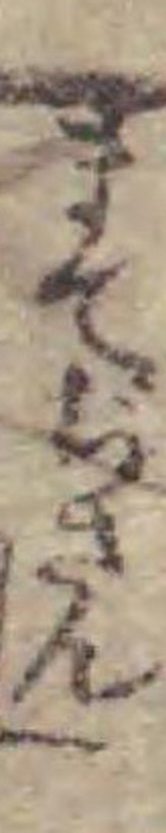までぢさんし
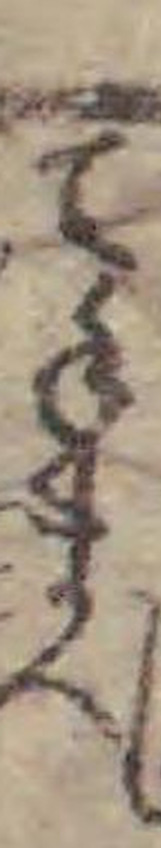て手まへ
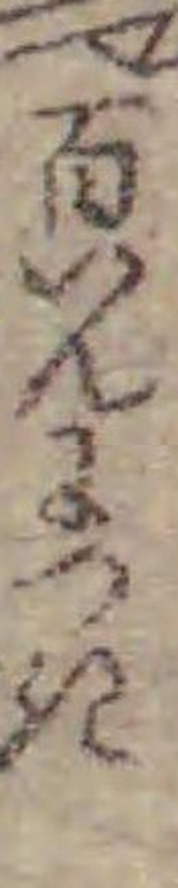百いんにつき
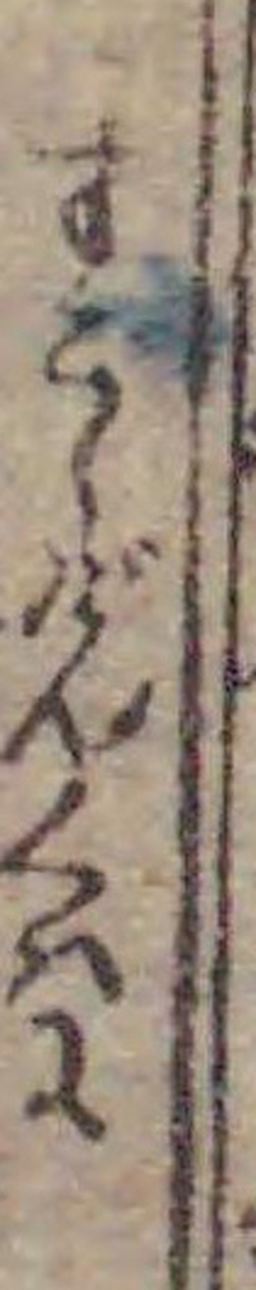すこしげんくはに
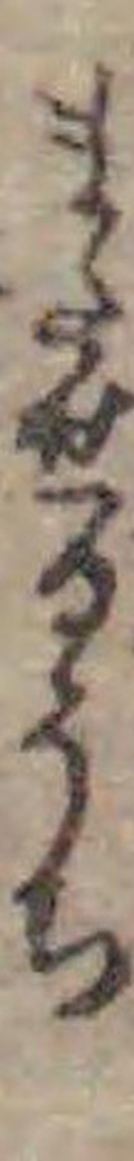またせるうち
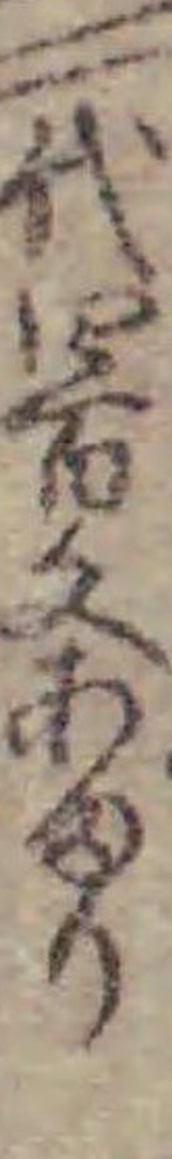代四百文あまり
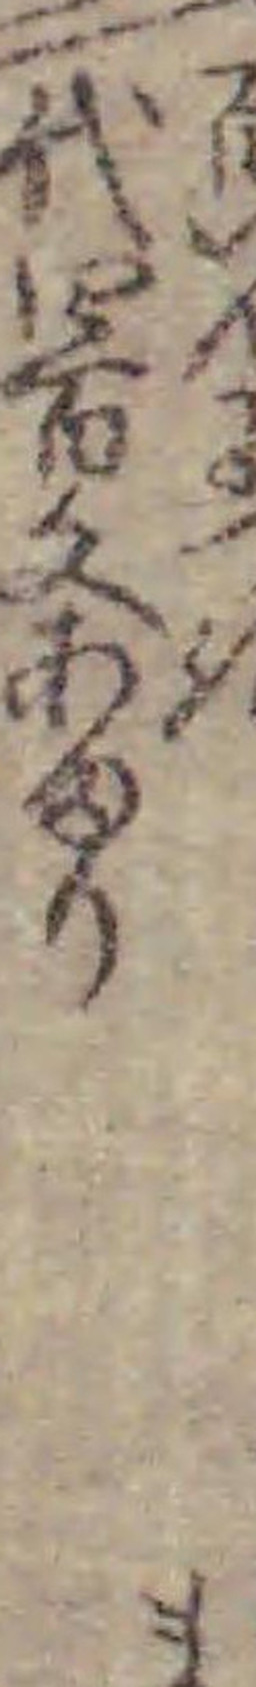代四百文あまり
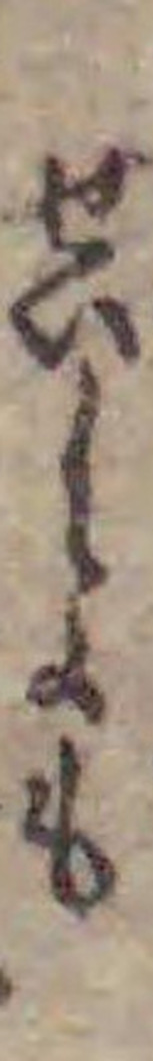せいしよも
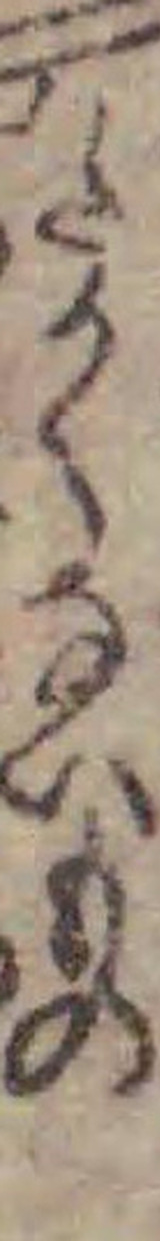たかくないもの
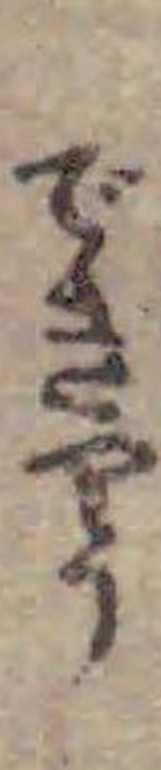できやす

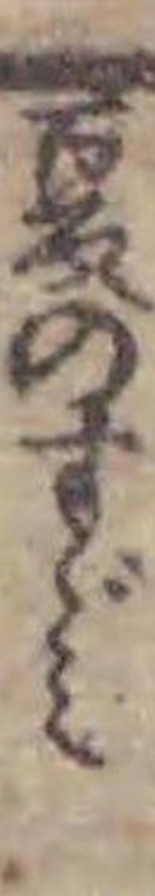夏のすゞみ
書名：本樹真猿浮気噺 : 3巻
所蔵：国立国会図書館 National Diet Library, JAPAN
